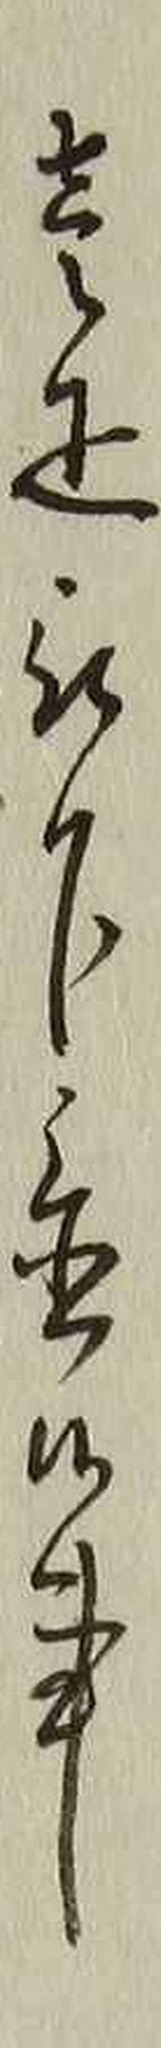壱疋被下置候事
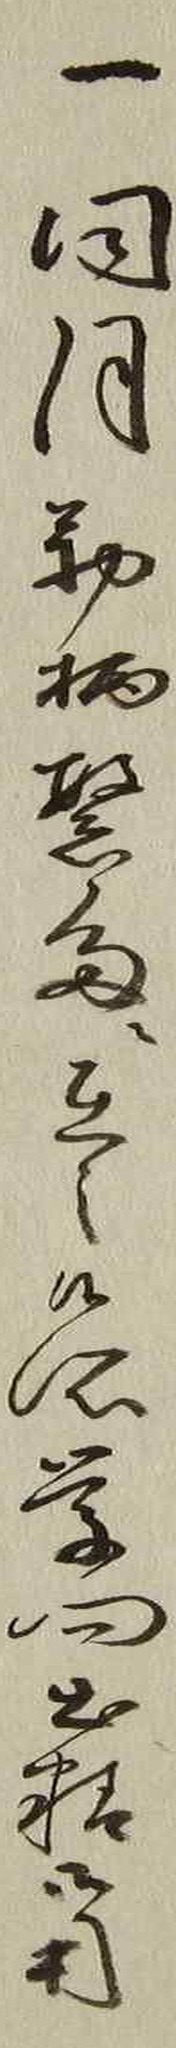一同月勤柄繁多ニ在之候所学問出精御用
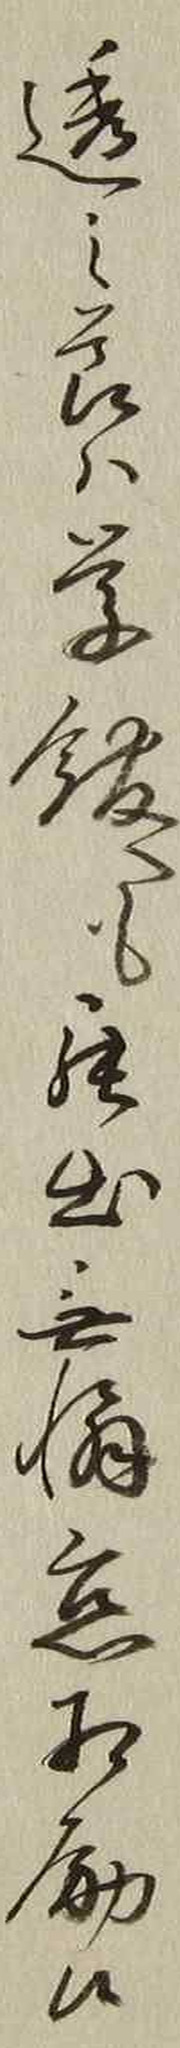透之節ハ学館へも罷出無懈怠相励候
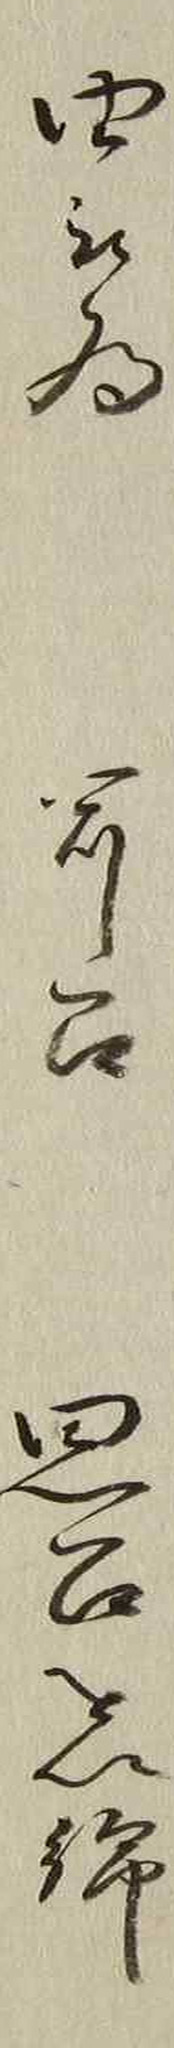由被為聞召思召を以綿
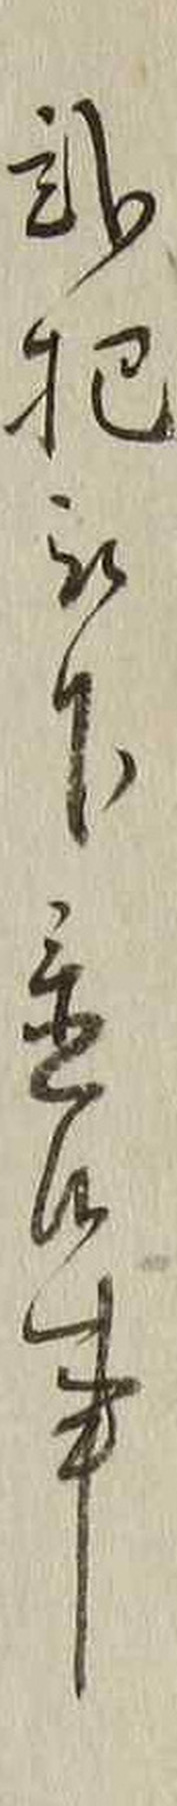弐把被下置候事
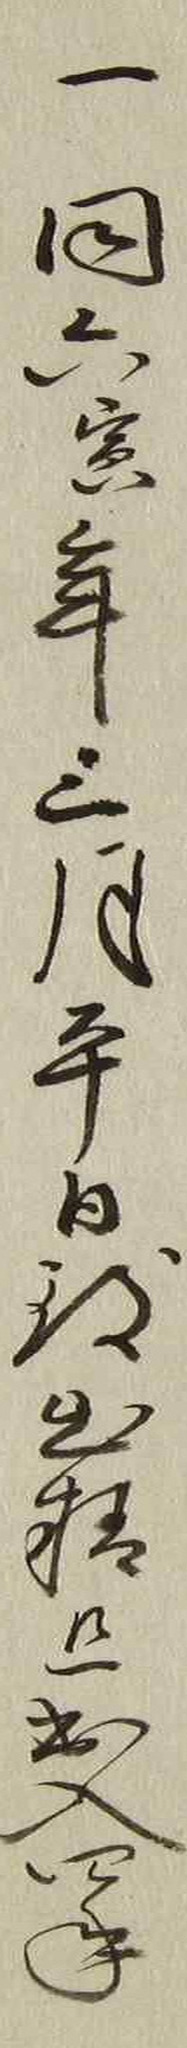一同六寅年三月平日致出精且出入四年
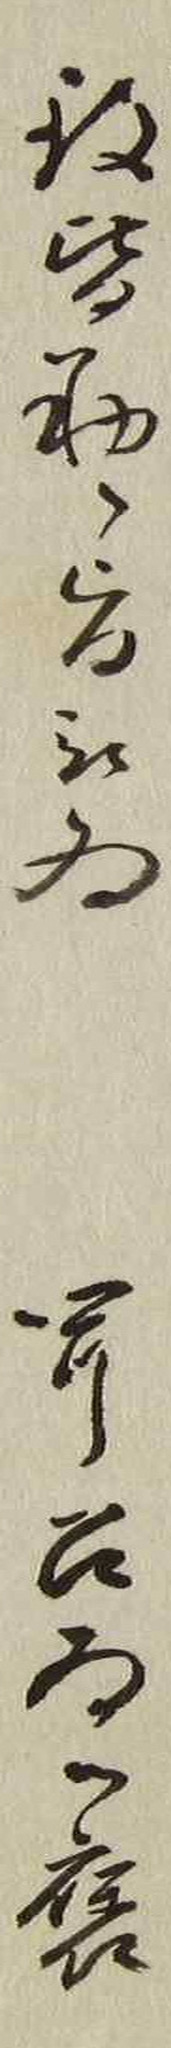致皆勤候旨被為聞召為御褒
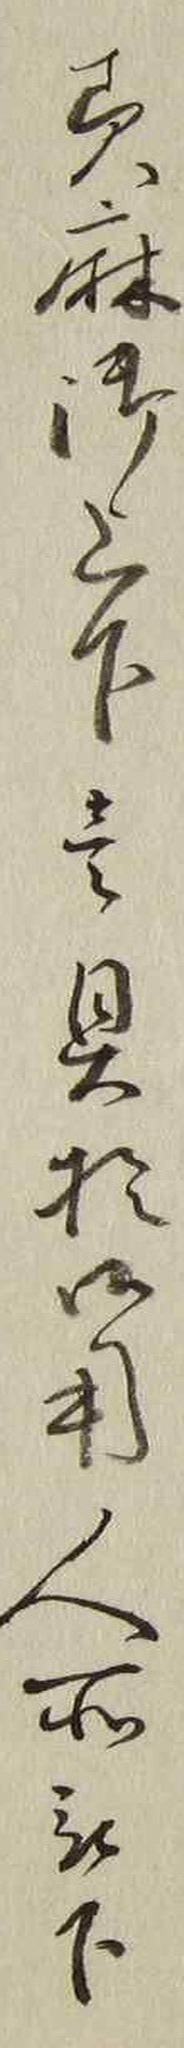美麻御上下壱具於御用人所被下
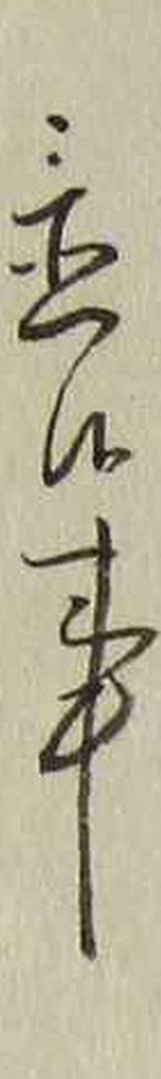置候事
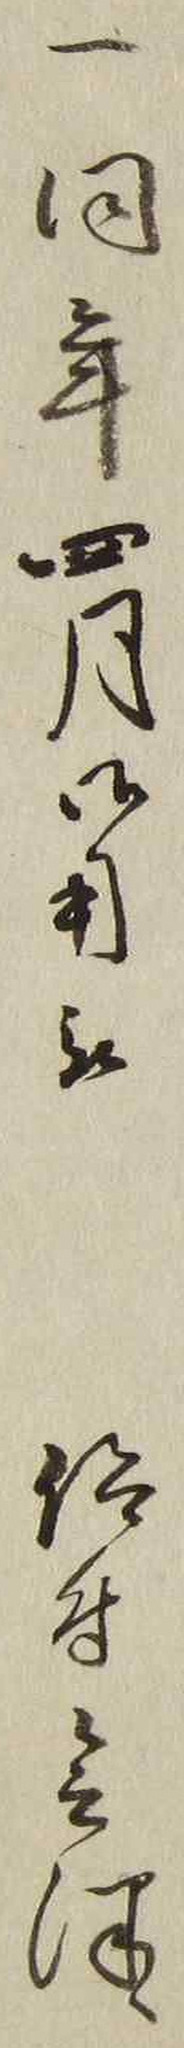一同年四月御用被仰付会津へ

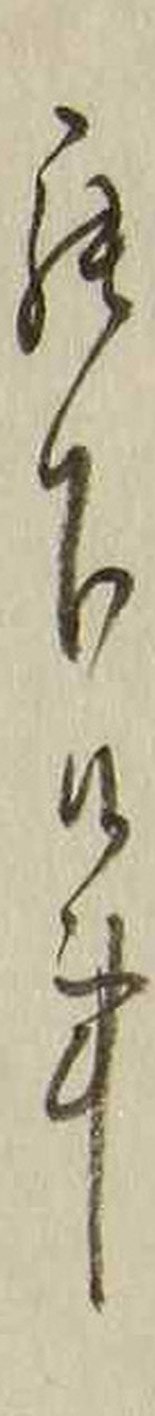罷下候事
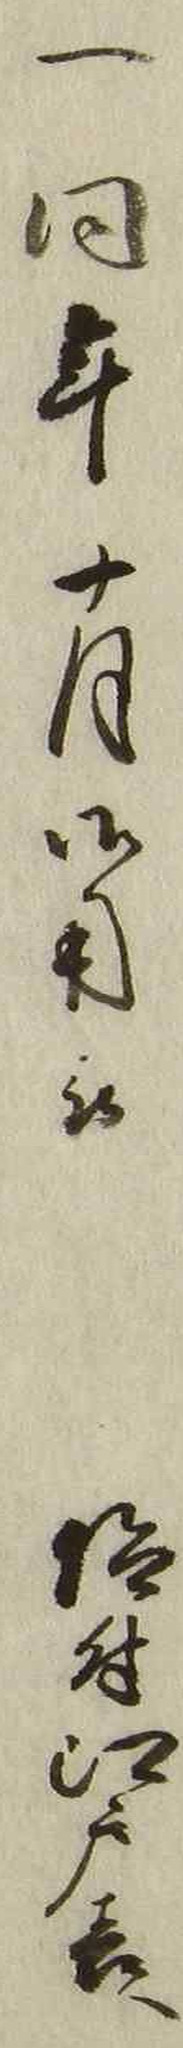一同年十月御用被仰付江戸表へ
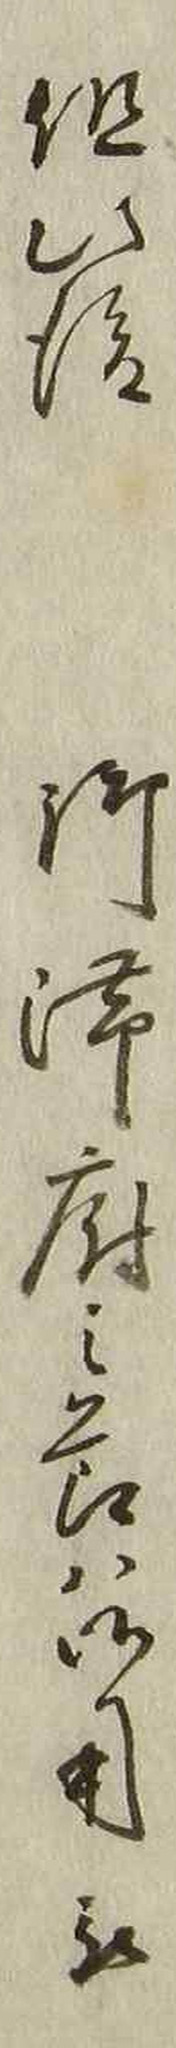但以後御滞府之節ハ御用被
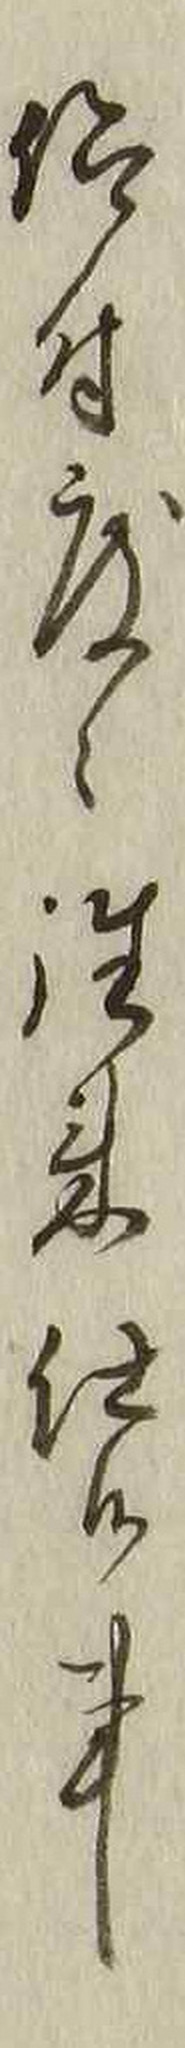仰付度々往来仕候事
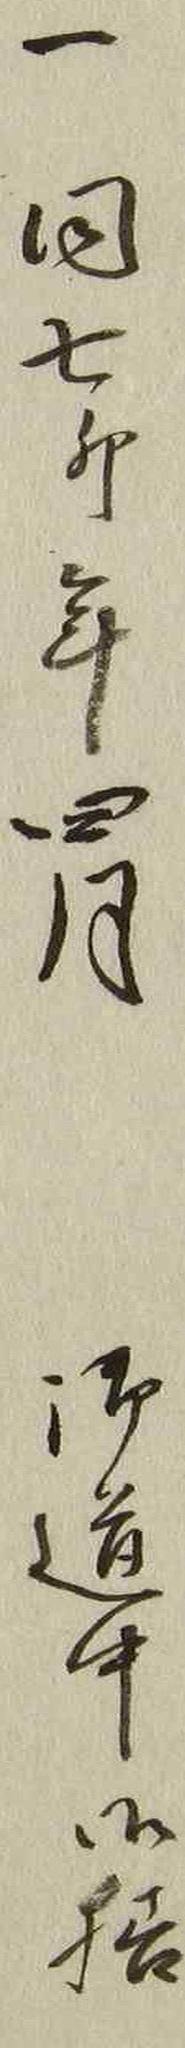一同七卯年四月御道中御膳
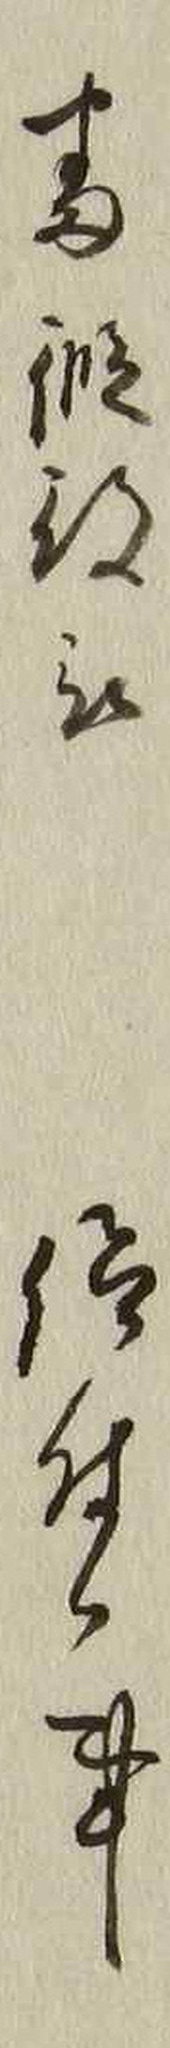番假役被仰付候事
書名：諸士系譜　巻之4　い之部4
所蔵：会津若松市立会津図書館
